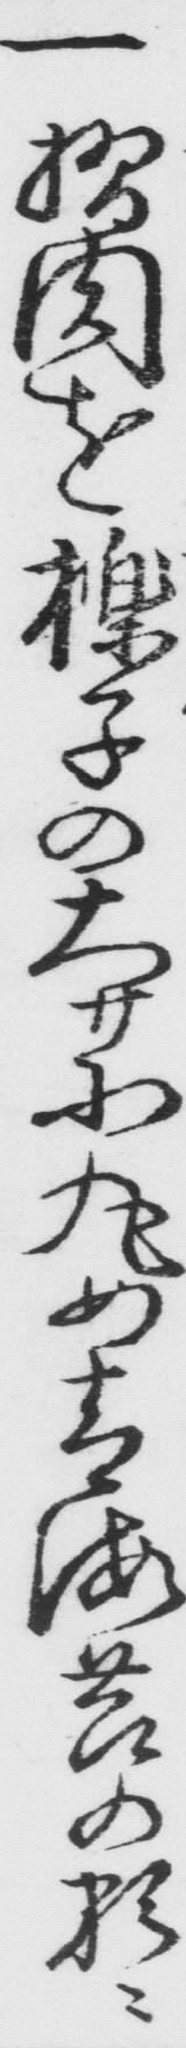一摺肉を檪子の大さに丸め青海苔の粉に
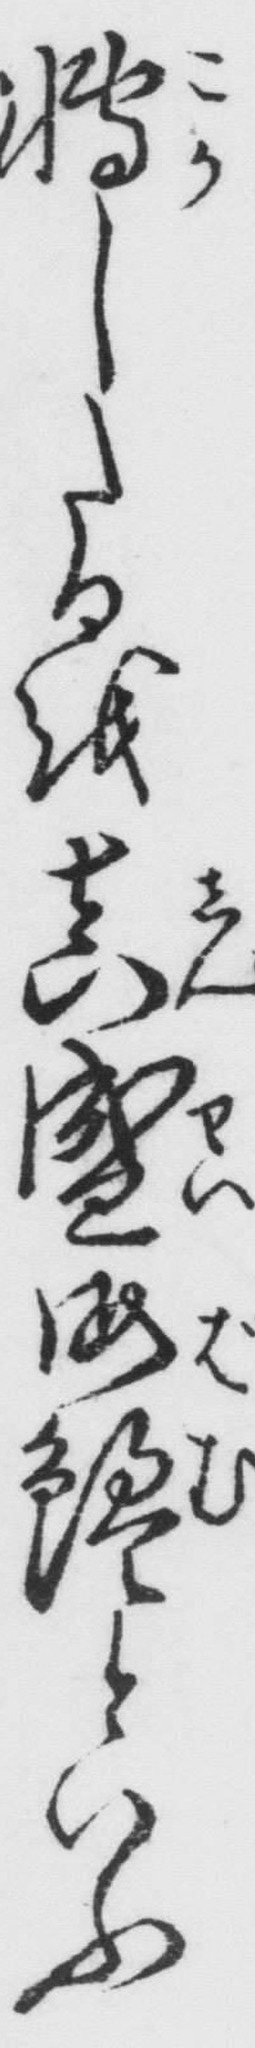轉したるを真盛海鱧といふ
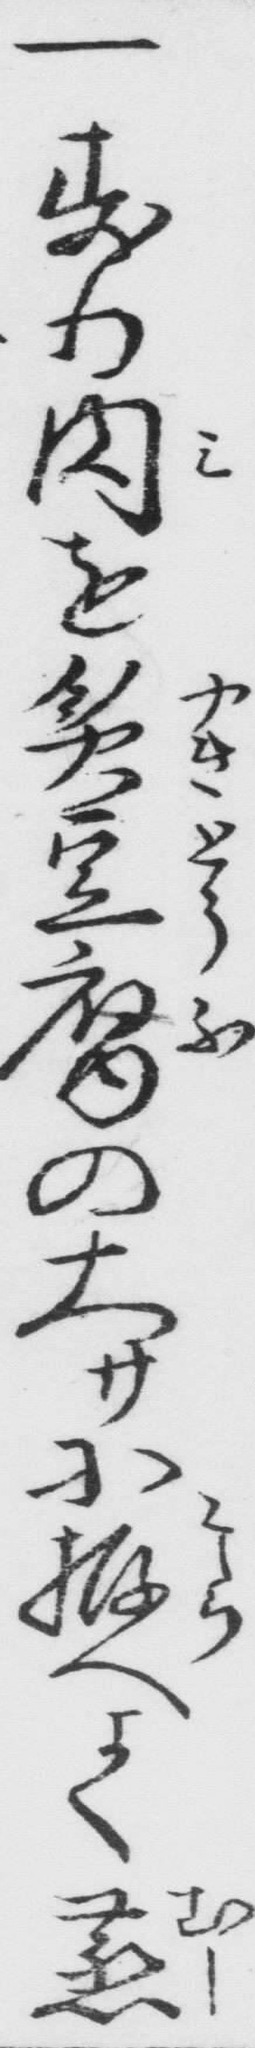一すり肉を炙豆腐の大さに拵よく蒸
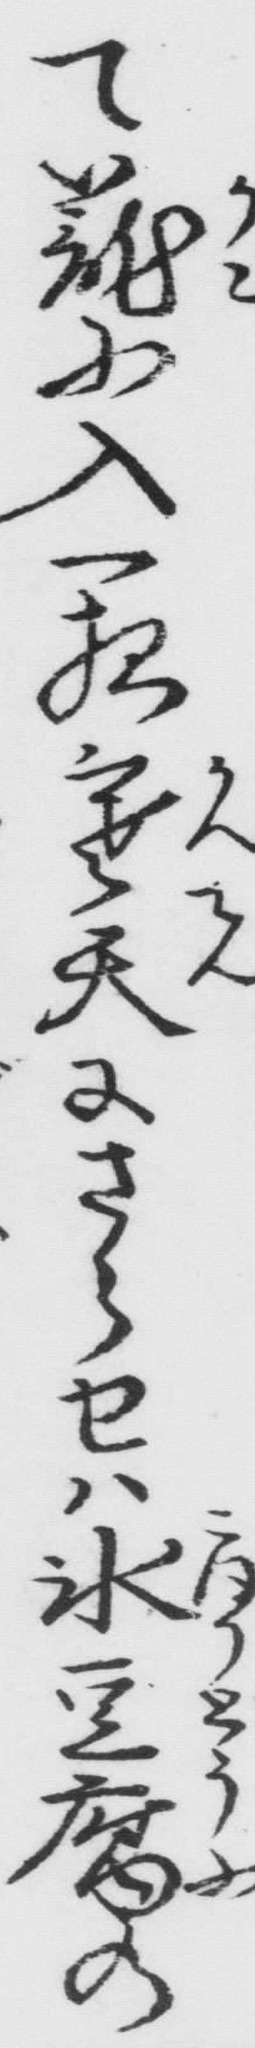て籠に入一夜寒天にさらせは氷豆腐の
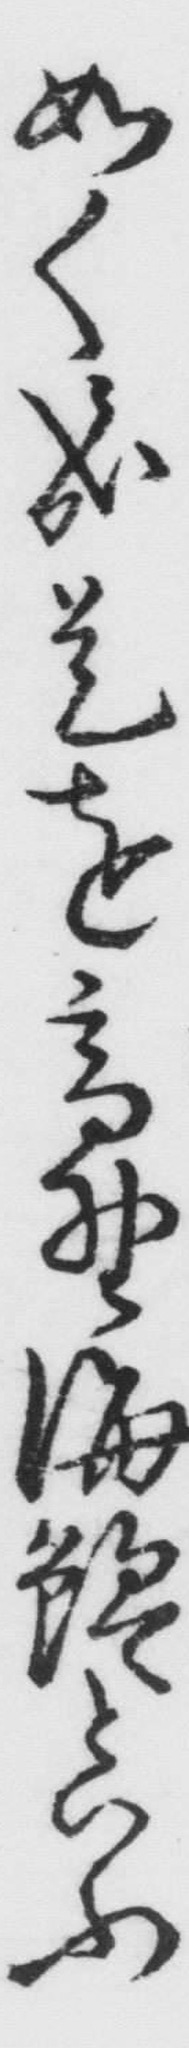如くに成是を高野海鱧といふ

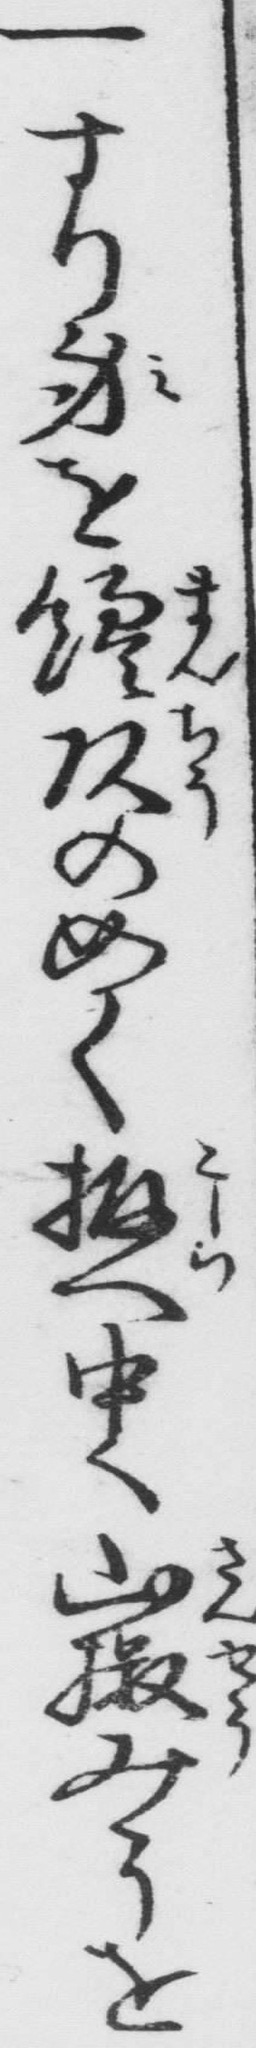一すり身を饅頭の如く拵へ中へ山椒みそを
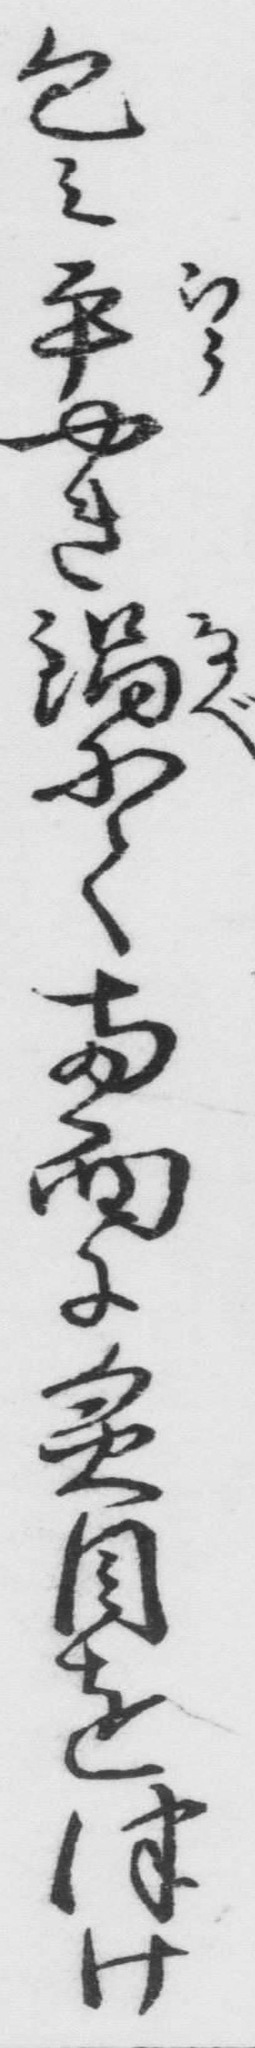包み平やき鍋にて両面に炙目を付け
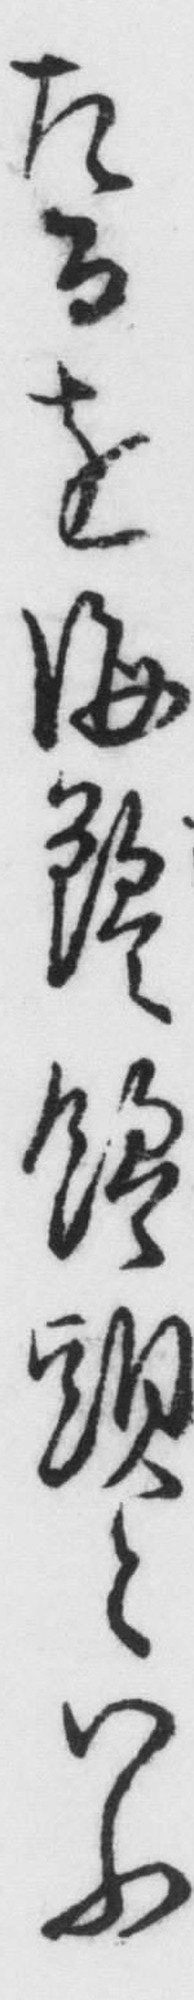たるを海鱧饅頭といふ
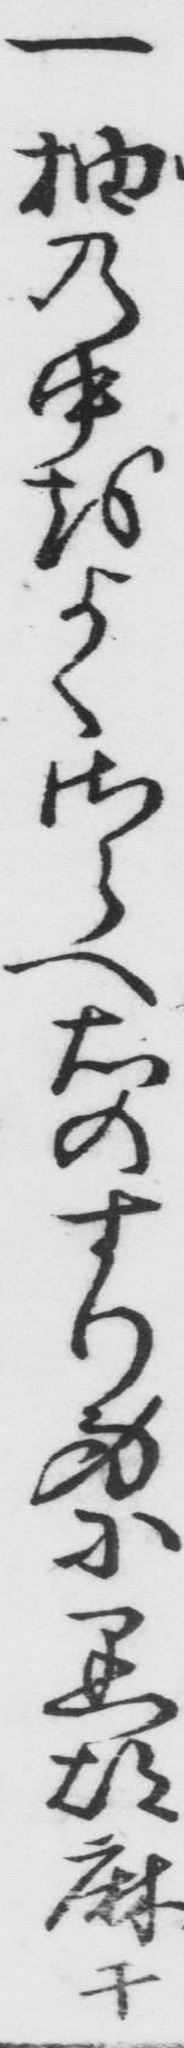一柚の中をよくさらへ右のすり身に黒胡麻干
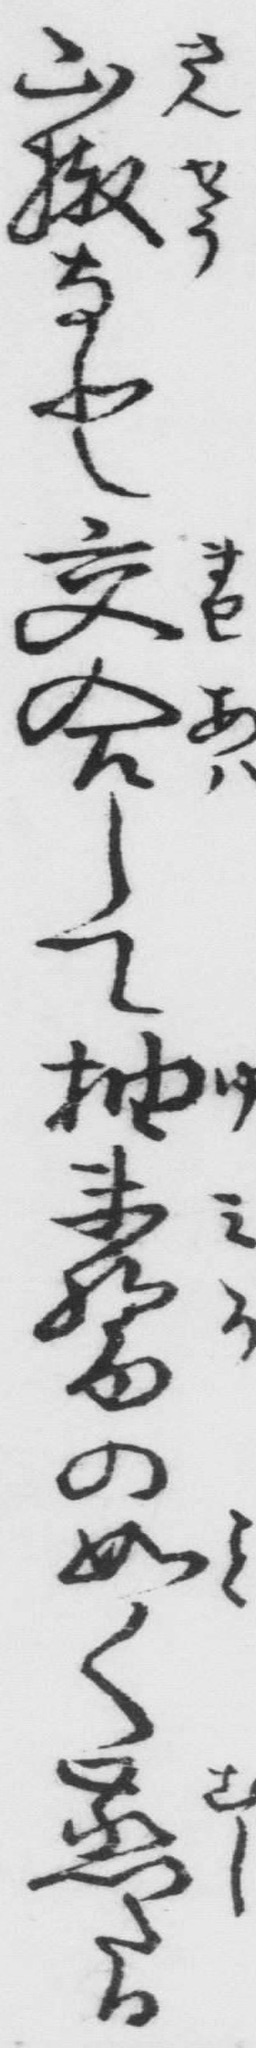山椒なと交合して柚未醤の如く蒸たる
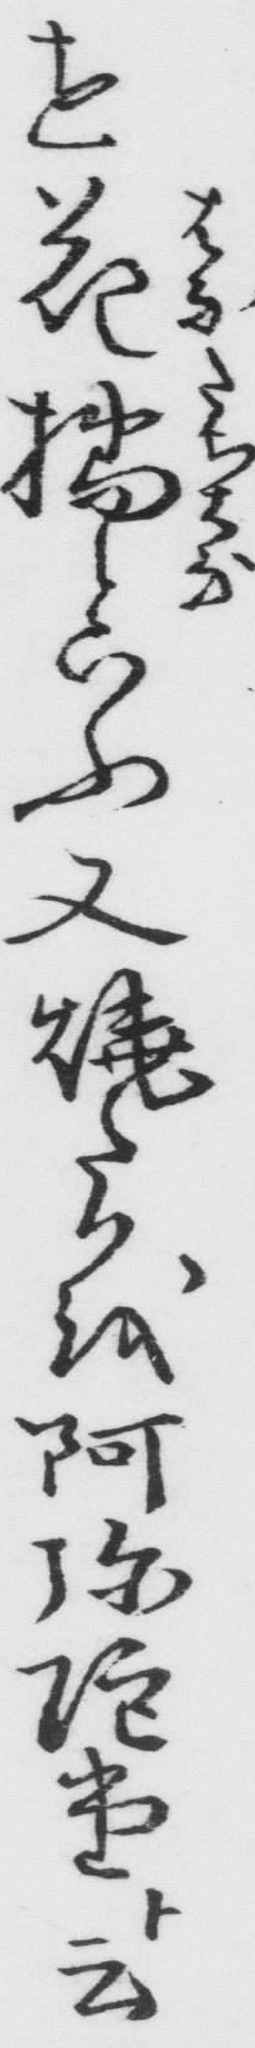を花橘といふ又燒たるを阿弥陀堂と云
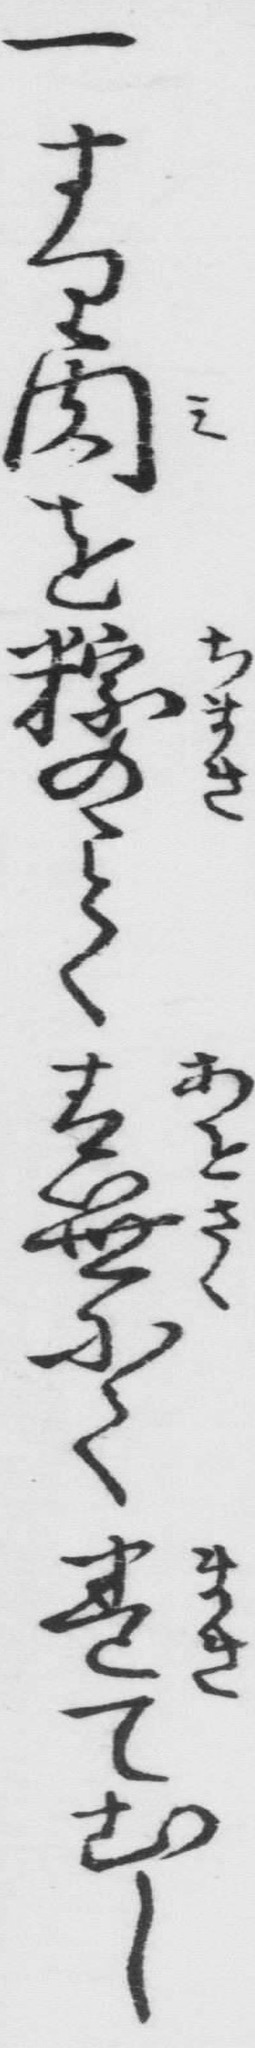一すり肉を粽のことく青笹にて巻てむし
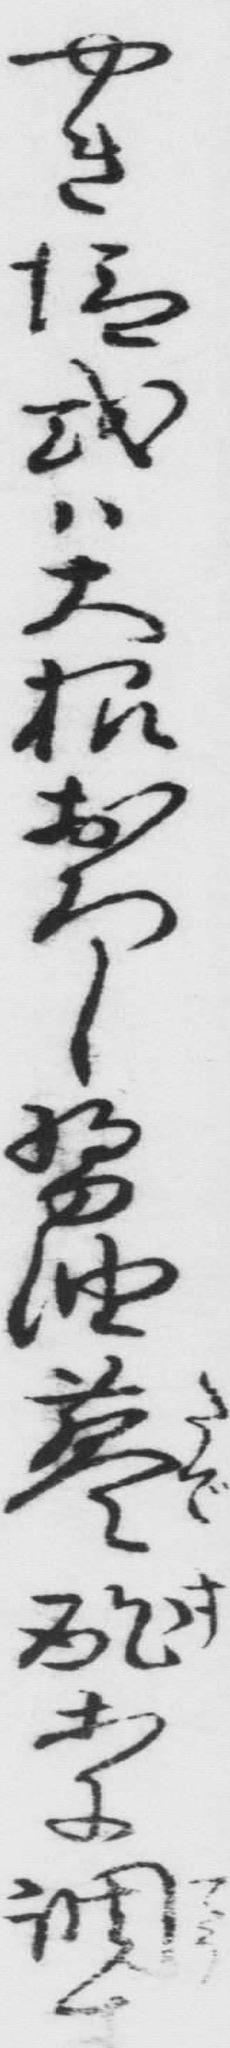やき塩或は大根おろし醤油蓼酢等に調す
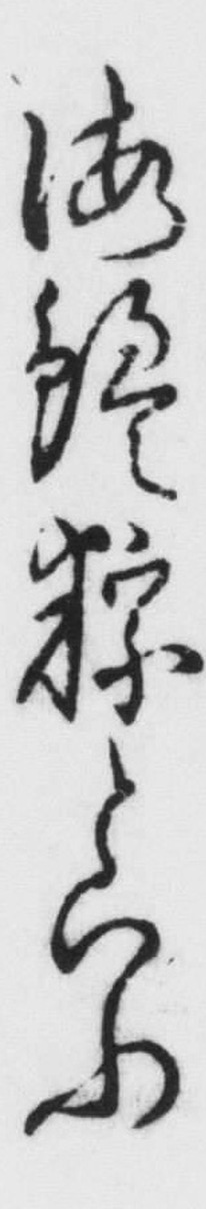海鱧粽といふ
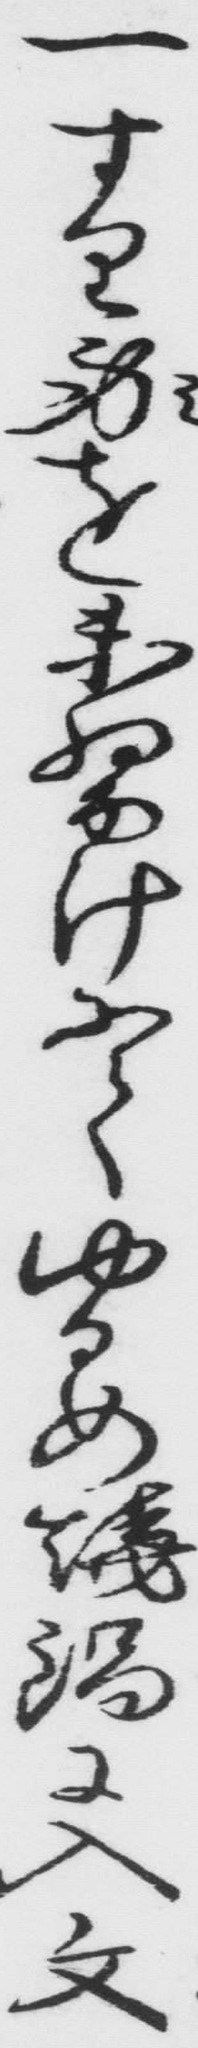一すり身を未醤汁にてゆるめ燒鍋に入文
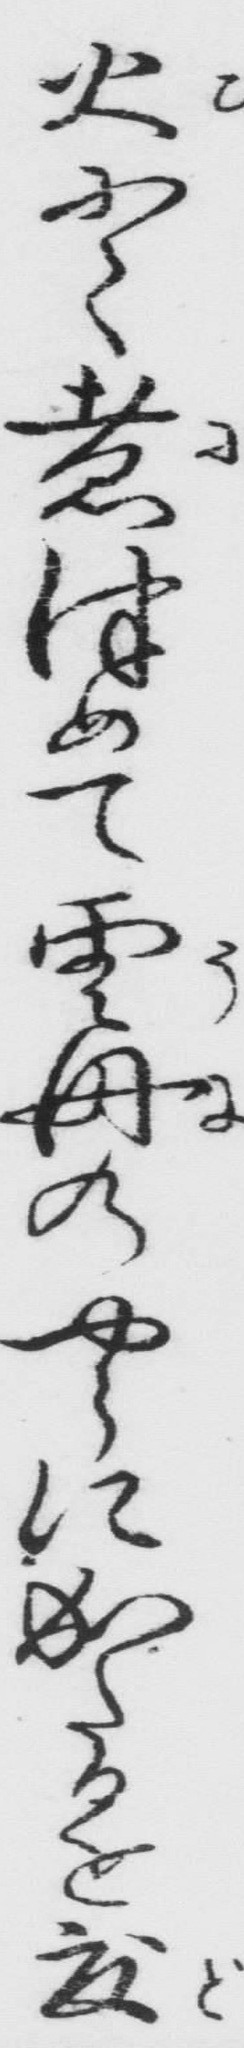火にて煮つめて雲丹のやうに成たるを度
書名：海鰻百珍
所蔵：大阪府立大学学術情報センター 国文学研究資料館
